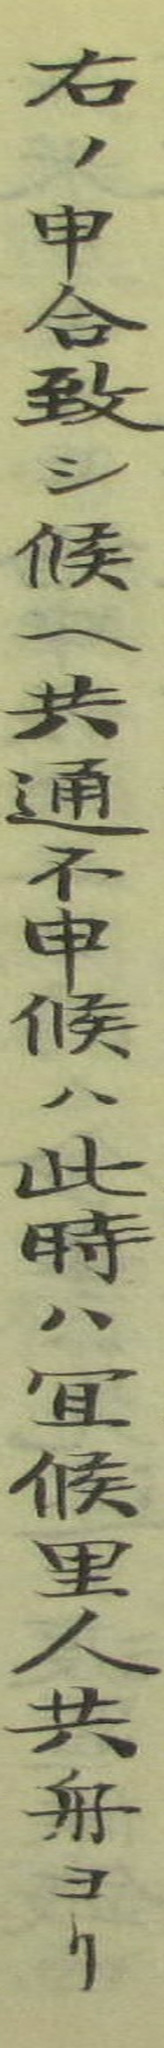右ノ申合致シ候ヘ共通不申候ハ此時ハ宜候里人共舟ヨリ
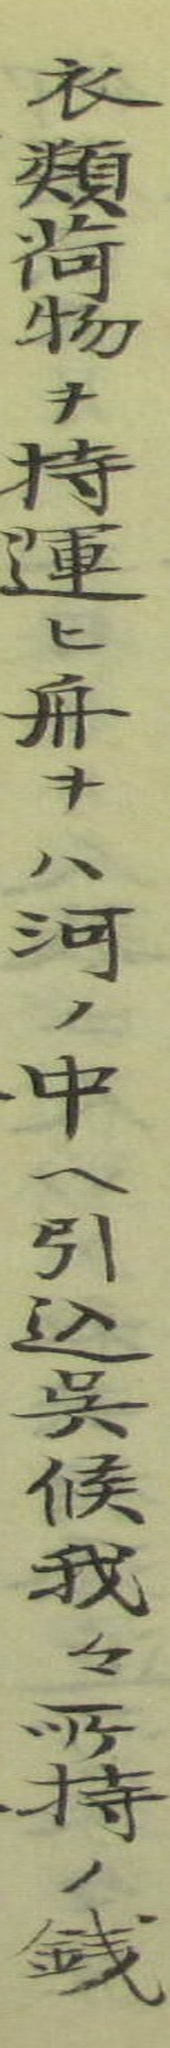衣類荷物ヲ持運ヒ舟ヲハ河ノ中ヘ引込呉候我々所持ノ銭
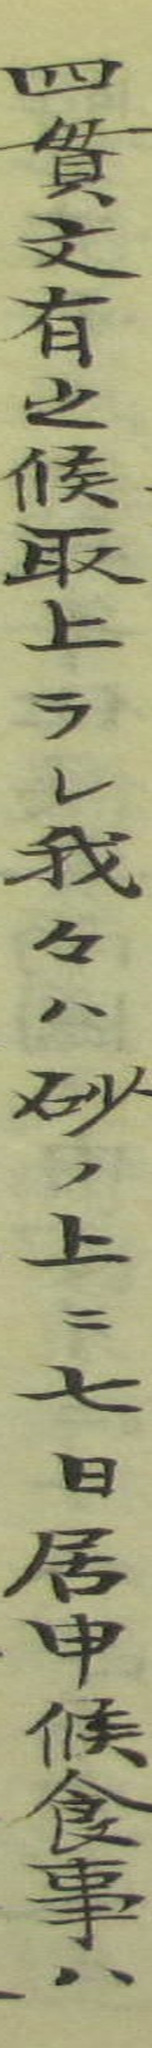四貫文有之候取上ラレ我々ハ砂ノ上ニ七日居申候食事ハ
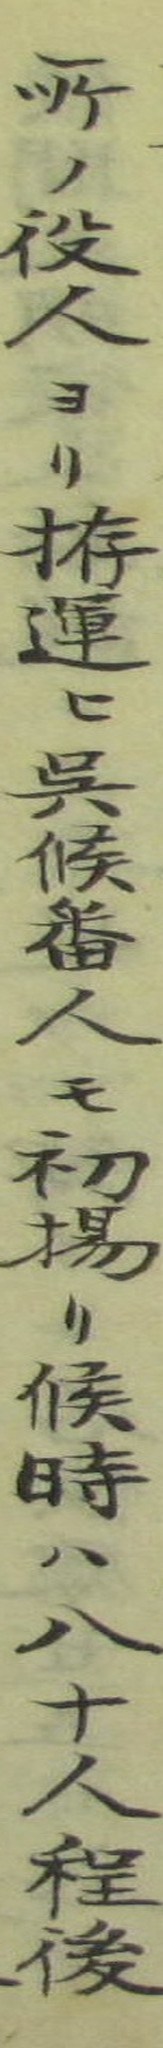所ノ役人ヨリ拵運ヒ呉候番人モ初揚リ候時ハ八十人程後
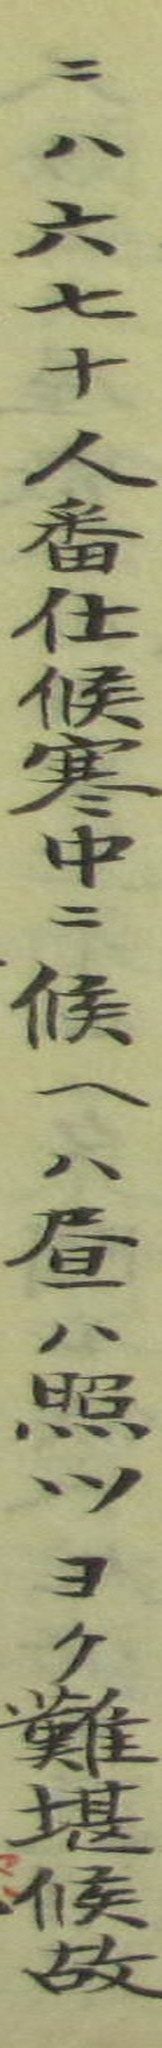ニハ六七十人番仕候寒中ニ候ヘハ昼ハ照ツヨク難堪候故
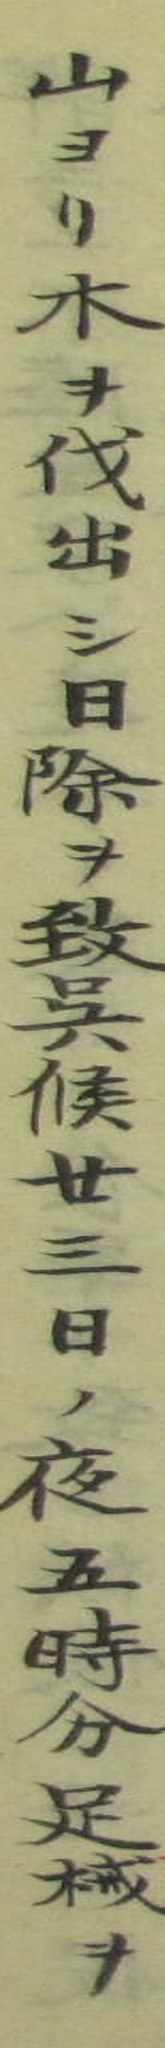山ヨリ木ヲ伐出シ日除ヲ致呉候廿三日ノ夜五時分足械ヲ

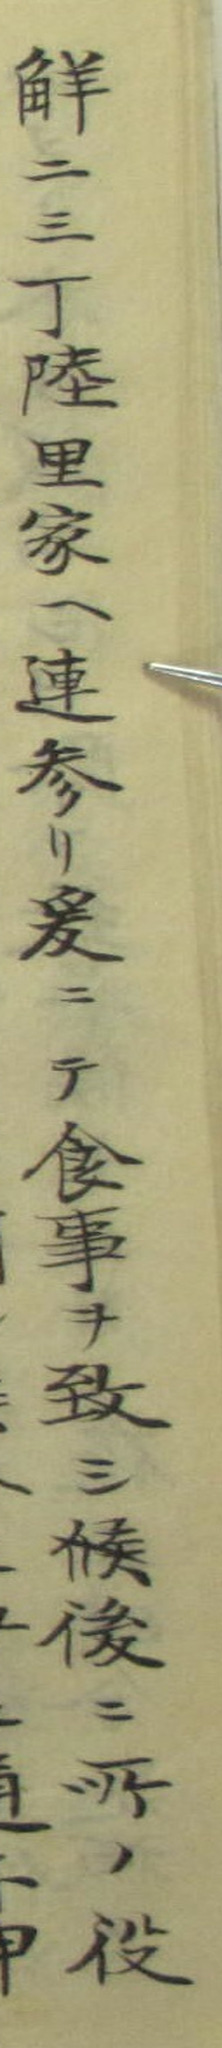鮮二三丁陸里家ヘ連参リ爰ニテ食事ヲ致シ候後ニ所ノ役
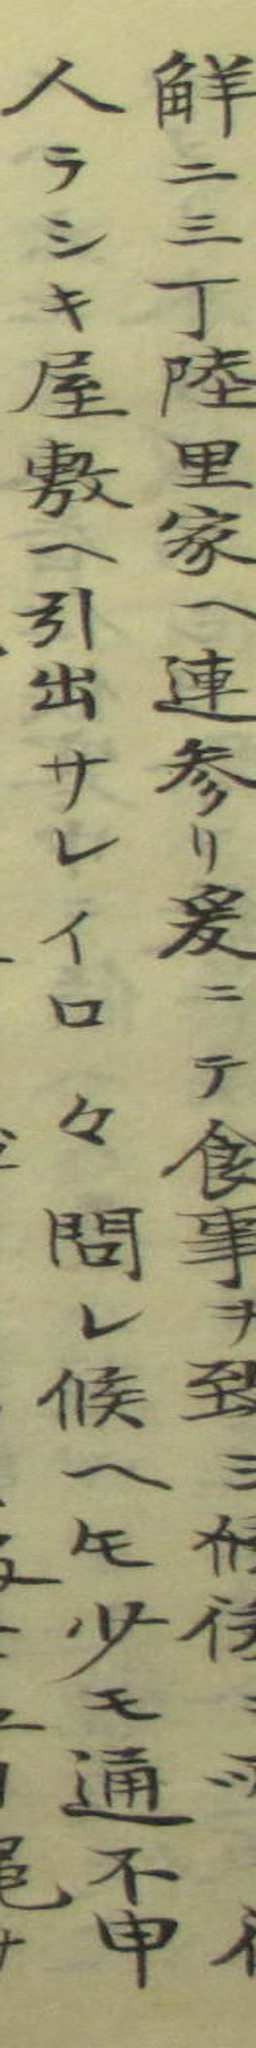人ラシキ屋敷ヘ引出サレイロ々問レ候ヘ供少モ通不申
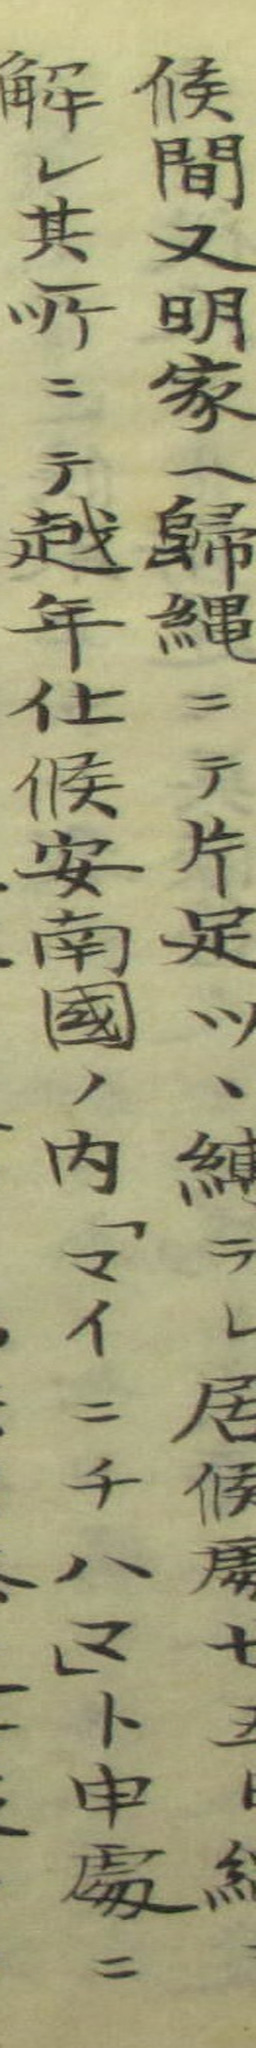候間又其所ニテ越年仕候安南國ノ内「マイニチハマ」ト申處ニ
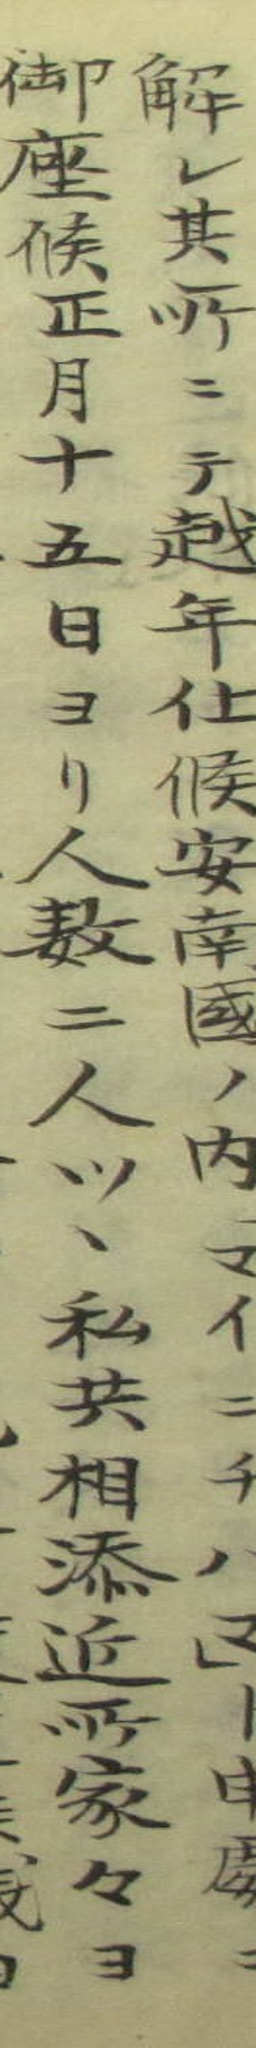御座候正月十五日ヨリ人数二人ツヽ私共相添近所家々ヨ
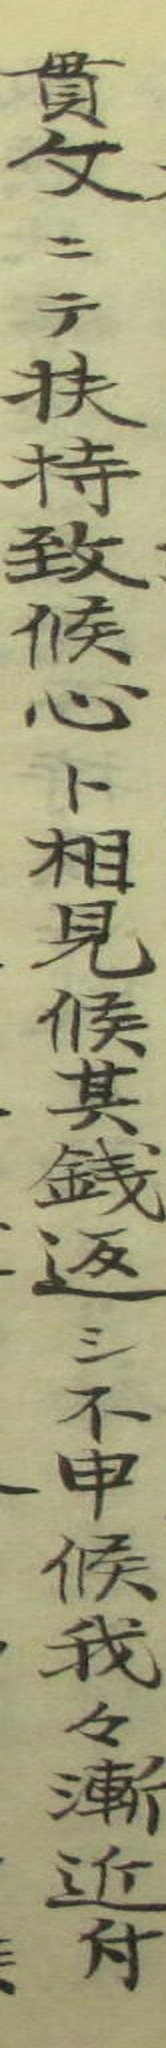貫文にて扶持致候心ト相見候其銭返シ不申候我々漸近付
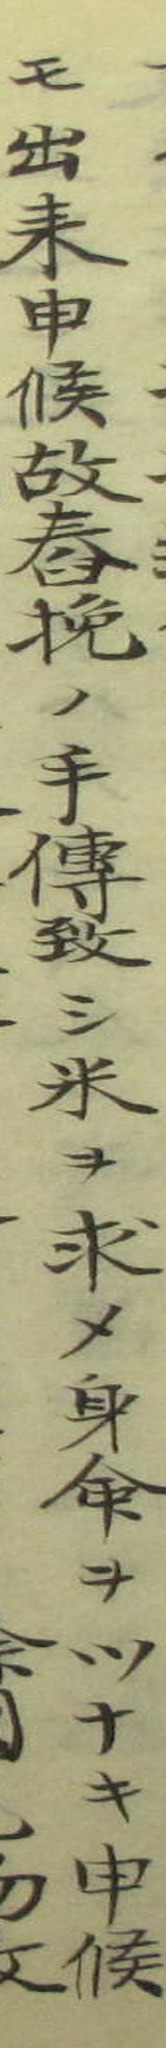モ出來申候故舂挽ノ手傳致シ米ヲ求メ身命ヲツナキ申候
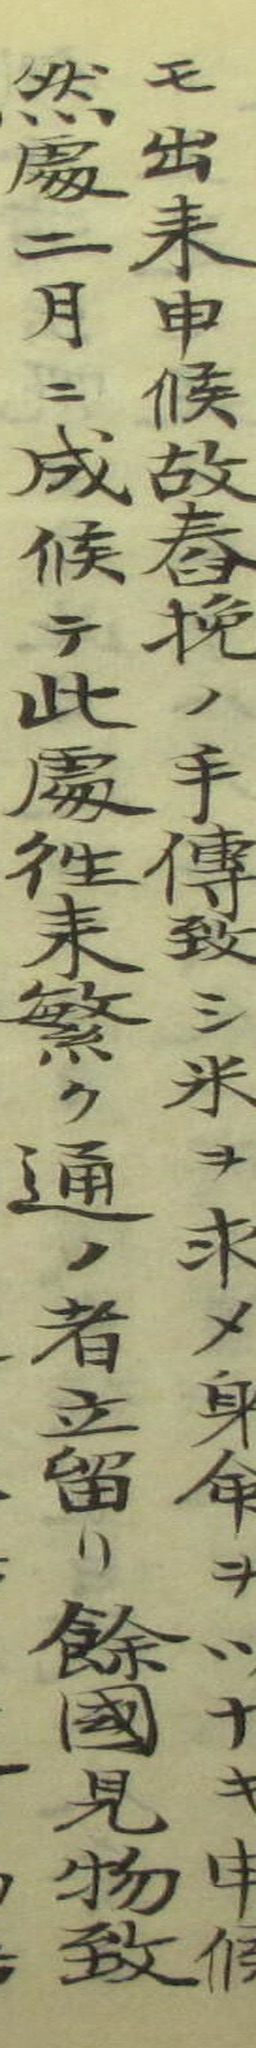然處二月ニ成候テ此處往来繁ク通ノ者立留リ餘國見物致
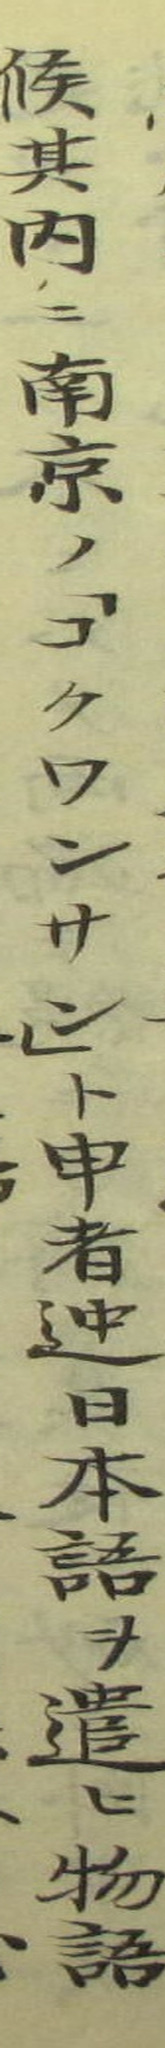候其内ニ南京ノ「コクワンサン」ト申者迚日本語ヲ遣ヒ物語
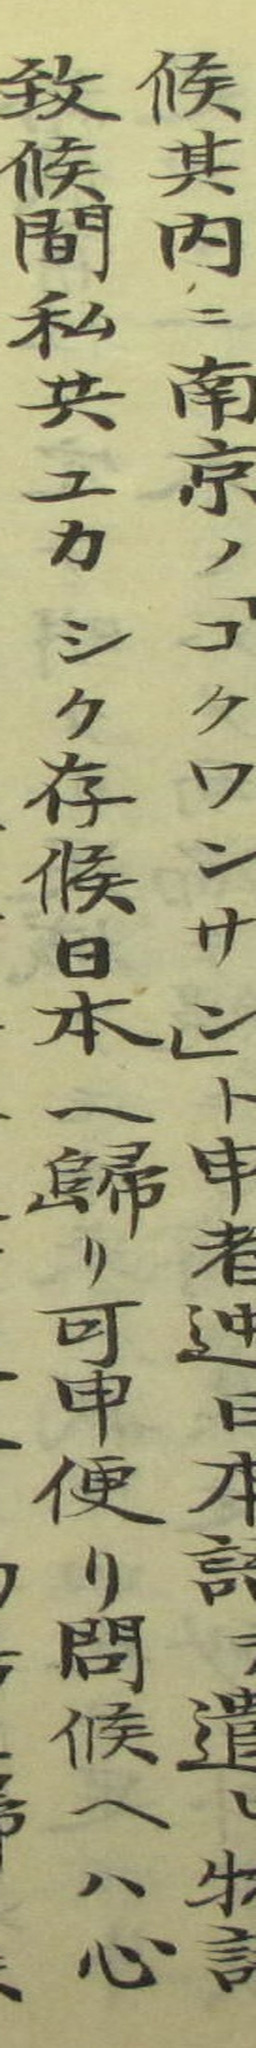致候間私共ユカシク存候日本ヘ帰リ可申便リ問候ヘハ心
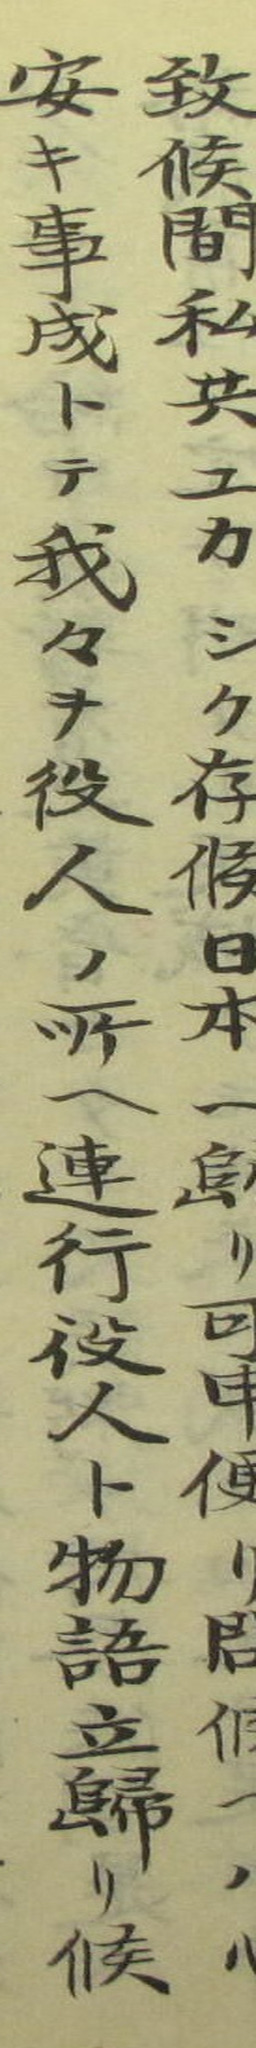安キ事成トテ我々ヲ役人ノ所ヘ連行役人ト物語立帰リ候
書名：異国船漂着記 外二
